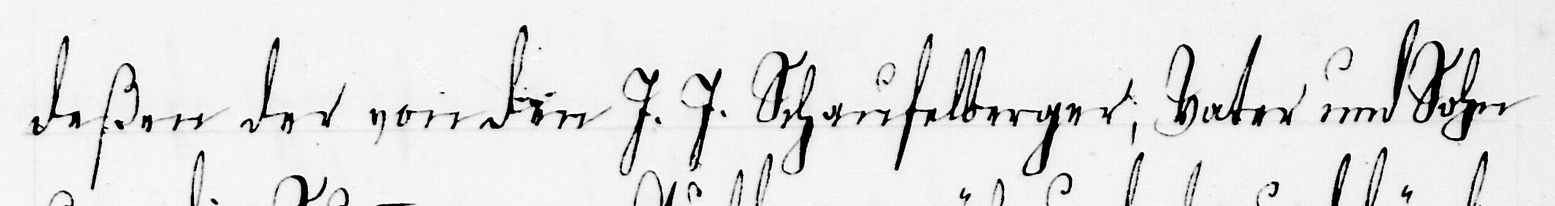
deßen der von den J. J. Schaufelberger; Vater und Sohn
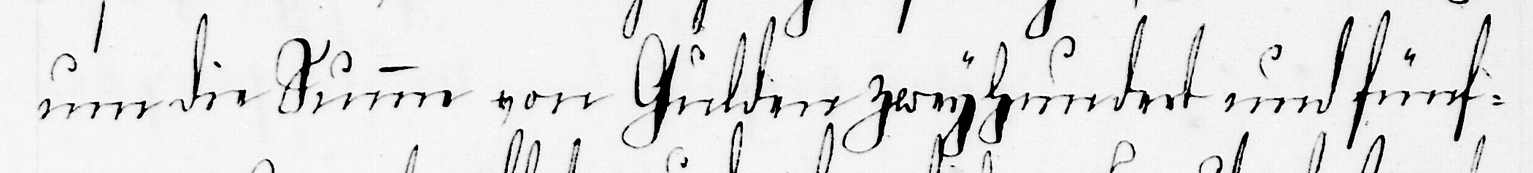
um die Summe von Gulden zweyhundert und fünf¬
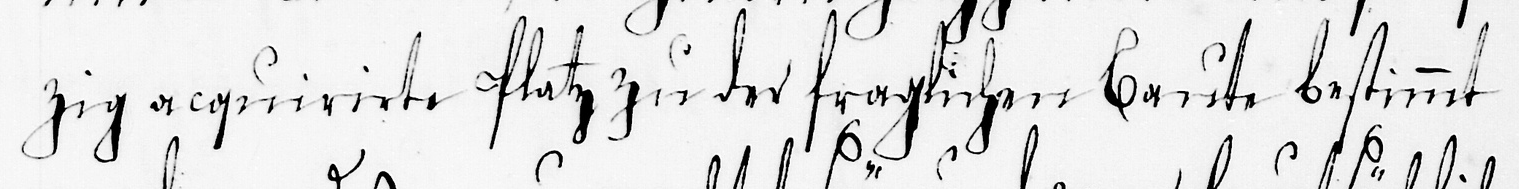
zig acquirirte Platz zu der fraglichen Baute bestimmt
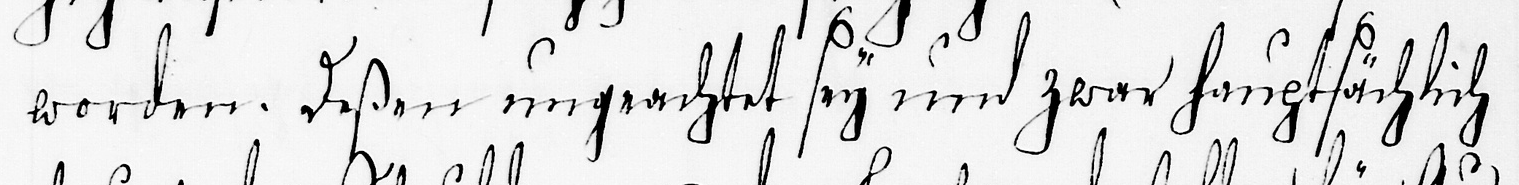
worden. Deßen ungeachtet sey und zwar hauptsächlich
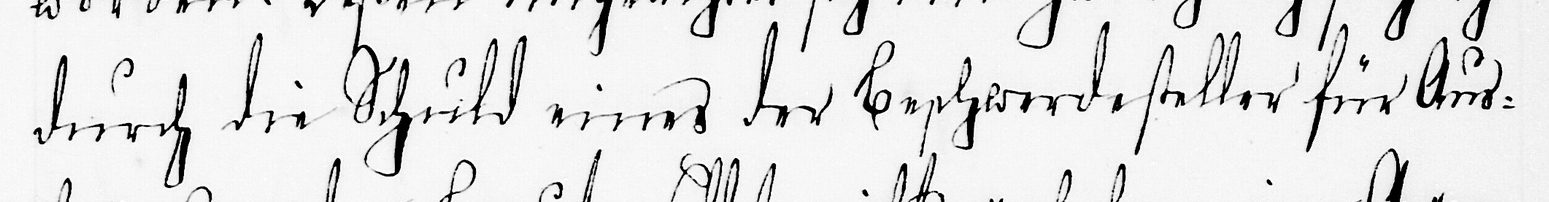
durch die Schuld eines der Beschwerdesteller für Aus¬
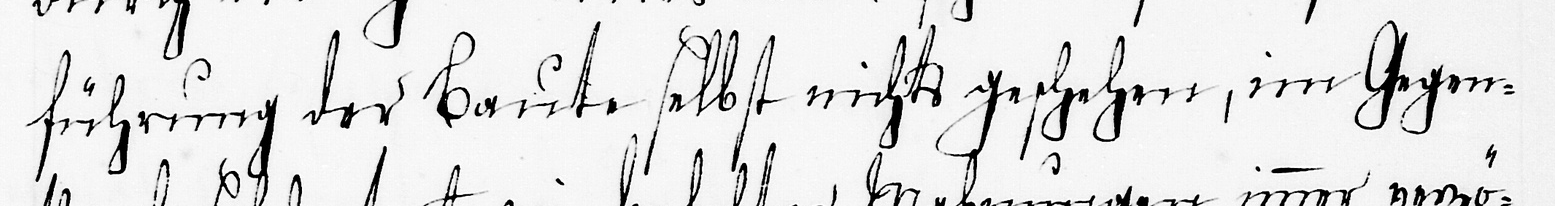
führung der Baute selbst nichts geschehen, im Gegen¬
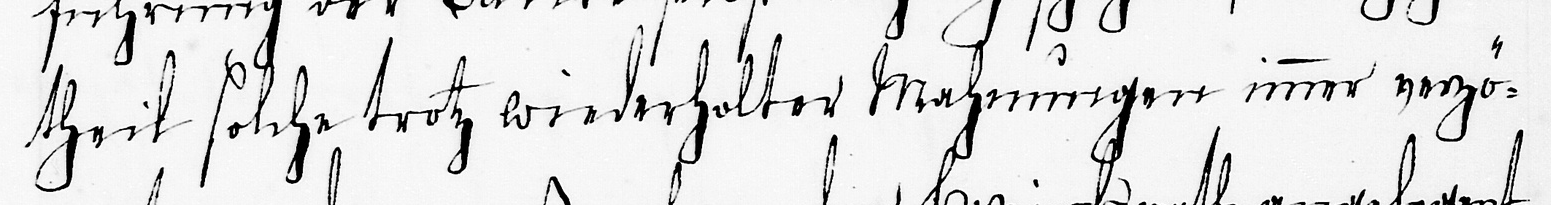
theil solche trotz wiederholter Mahnungen immer verzö¬
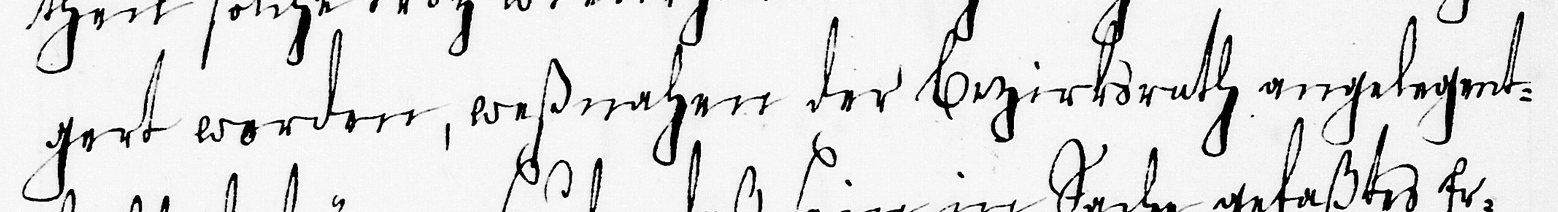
gert worden, weßnahen der Bezirksrath angelegent¬
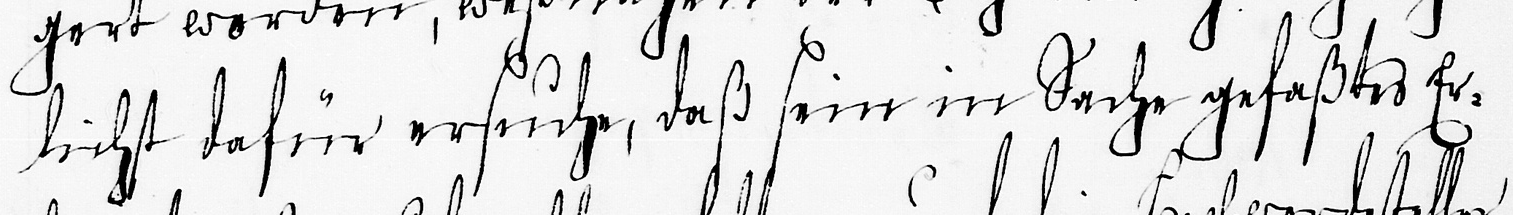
lichst dafür ersuche, daß sein in Sache gefaßtes Er¬
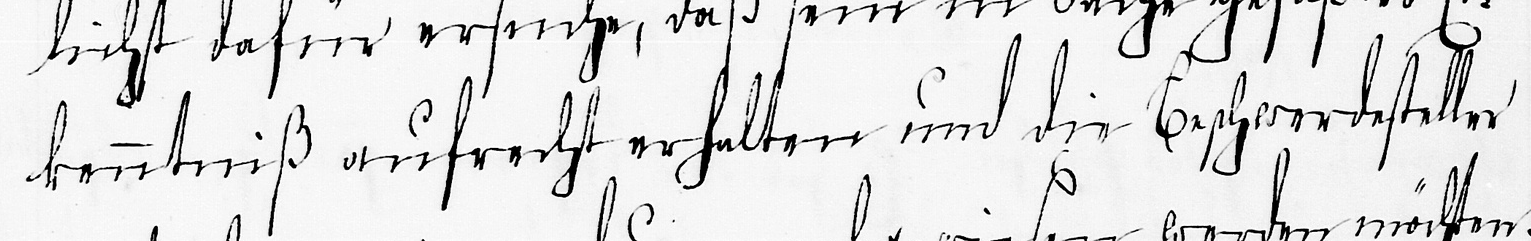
kenntniß aufrecht erhalten und die Beschwerdestell¬
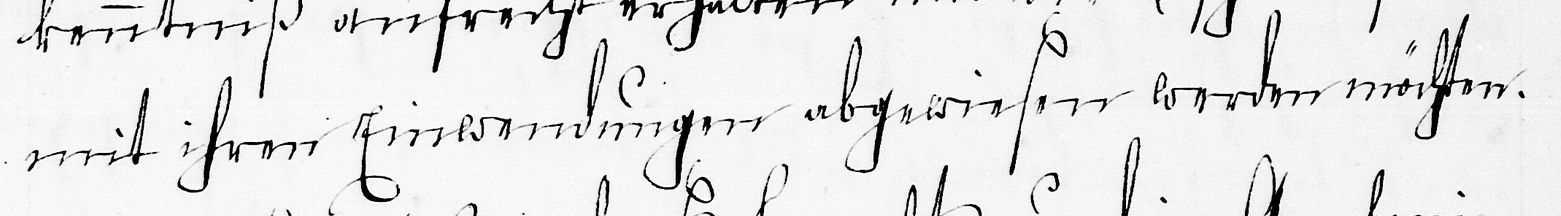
mit ihren Einwendungen abgewiesen werden möchten.
